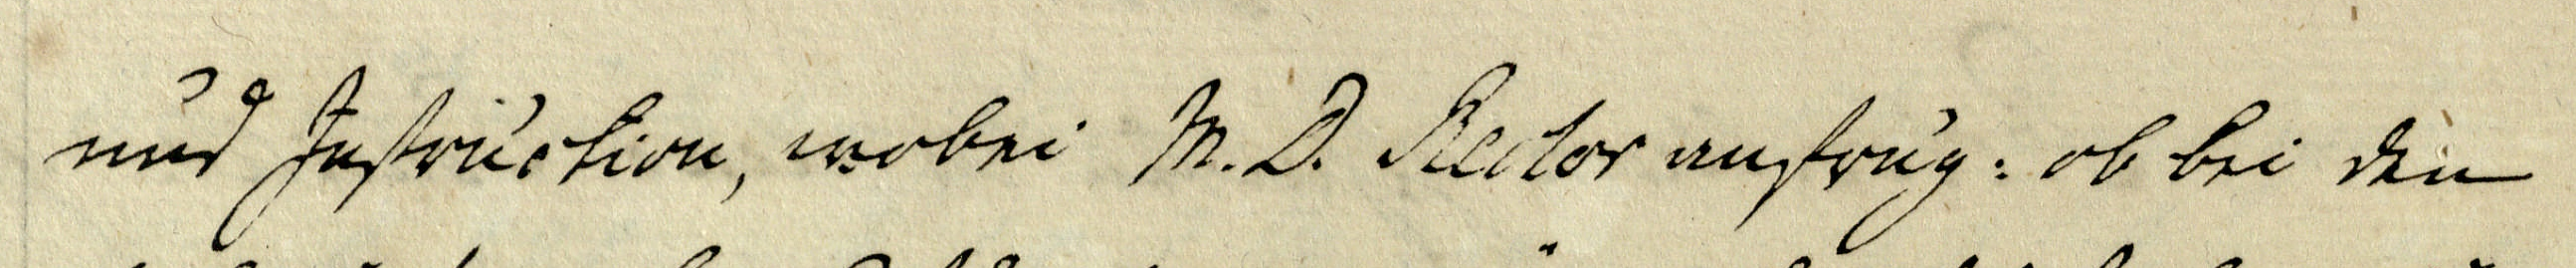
und Instruction, wobei M. D. Rector anfrug: ob bei den
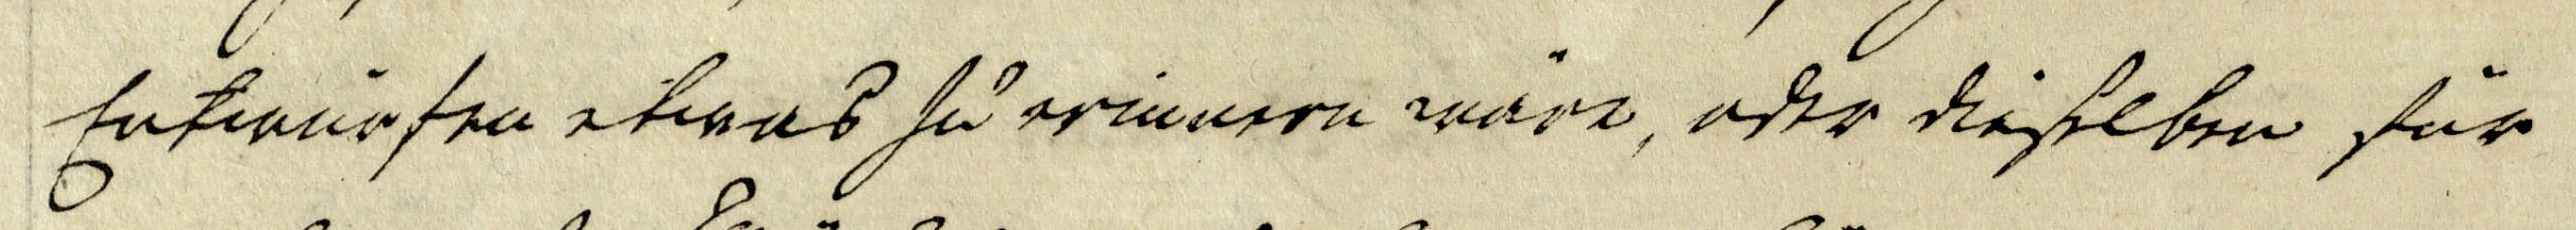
Entwürfen etwas zu erinnern wäre, oder dieselben für
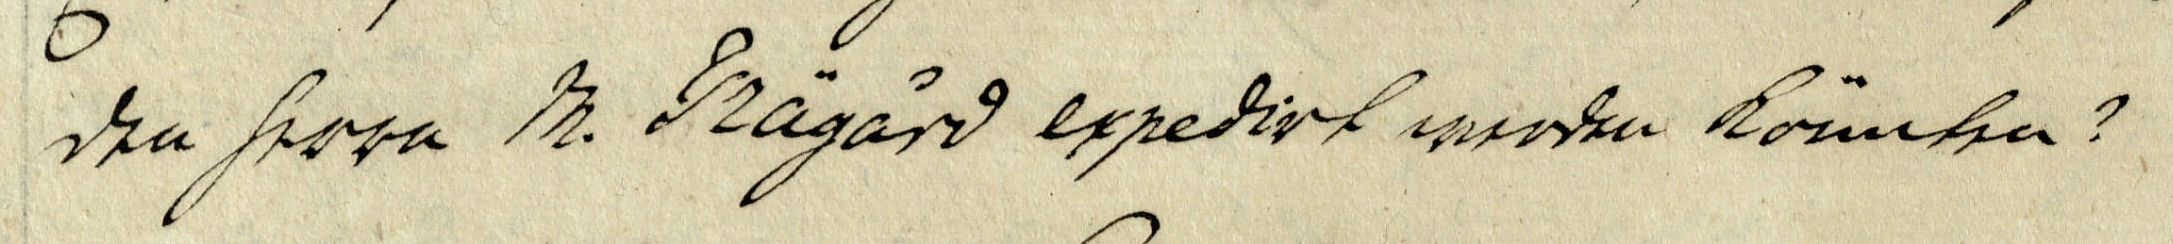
den Herrn M. Trägård expedirt werden könnten?
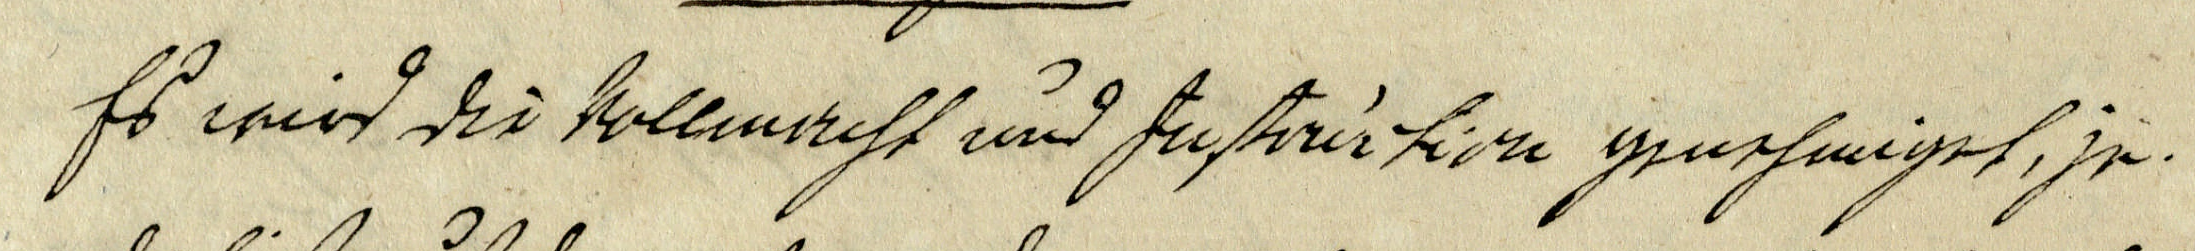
Es wird die Vollmacht und Instruction genehmiget, je¬
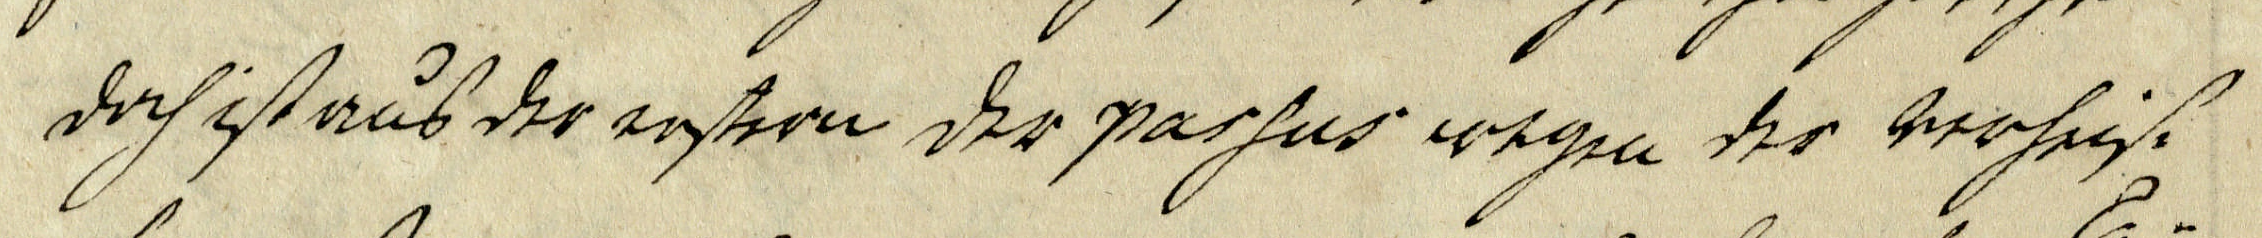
doch ist aus der erstern der passus wegen der verheis¬
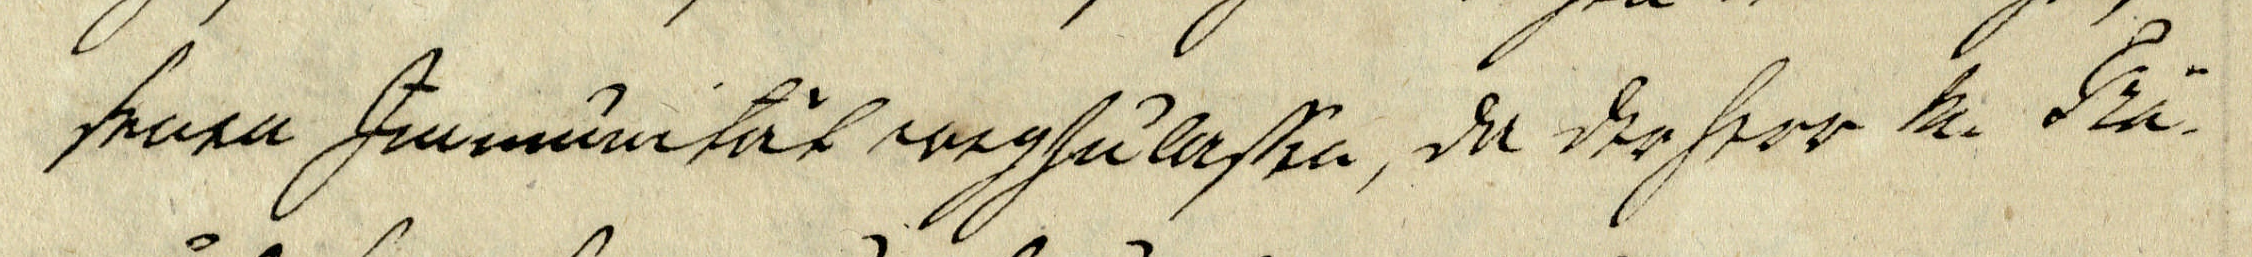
senen Immunität wegzulassen, da der Herr M. Trä¬
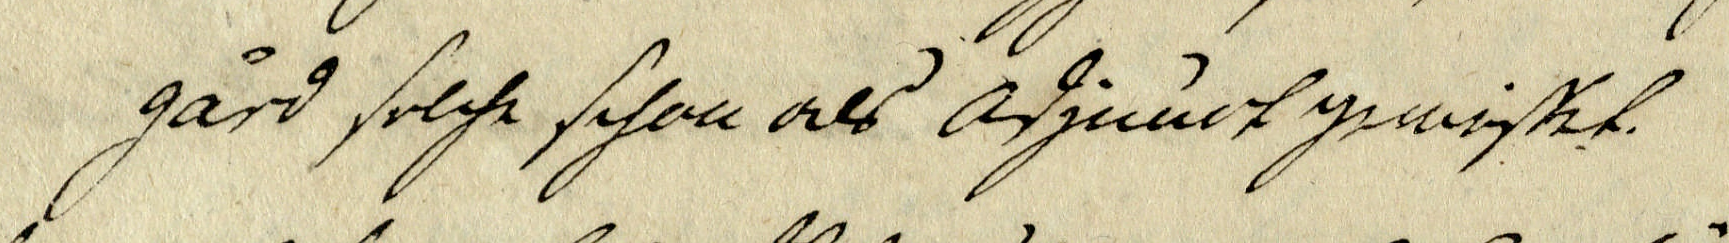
gård solche schon als Adjunct geniesset.
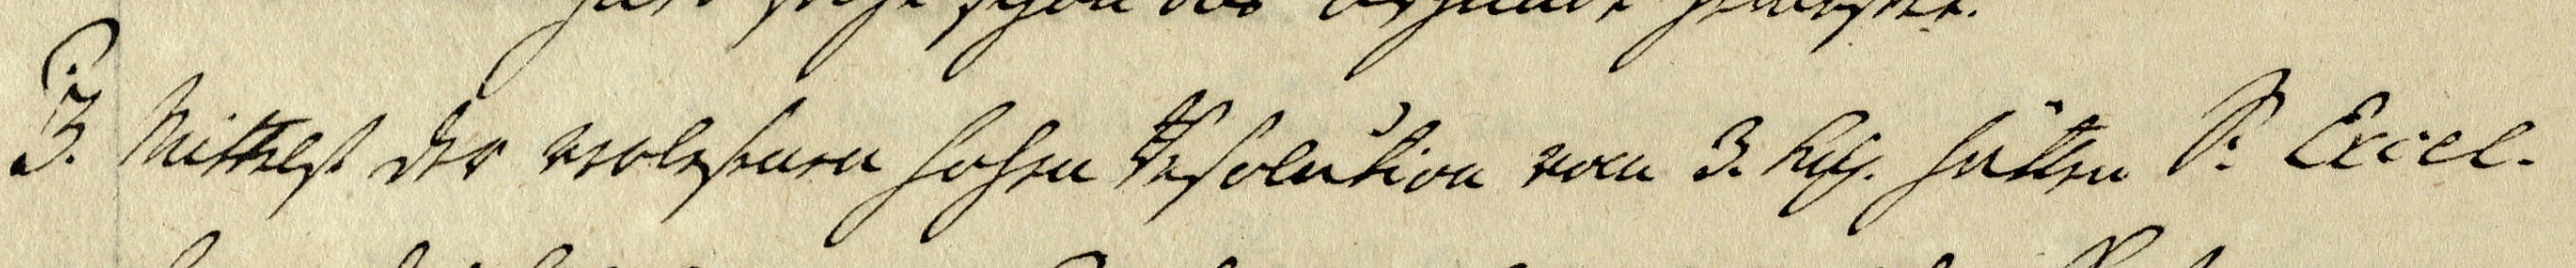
3. Mittelst der verlesenen hohen Resolution von 3. huj. hätten Sr. Excel¬
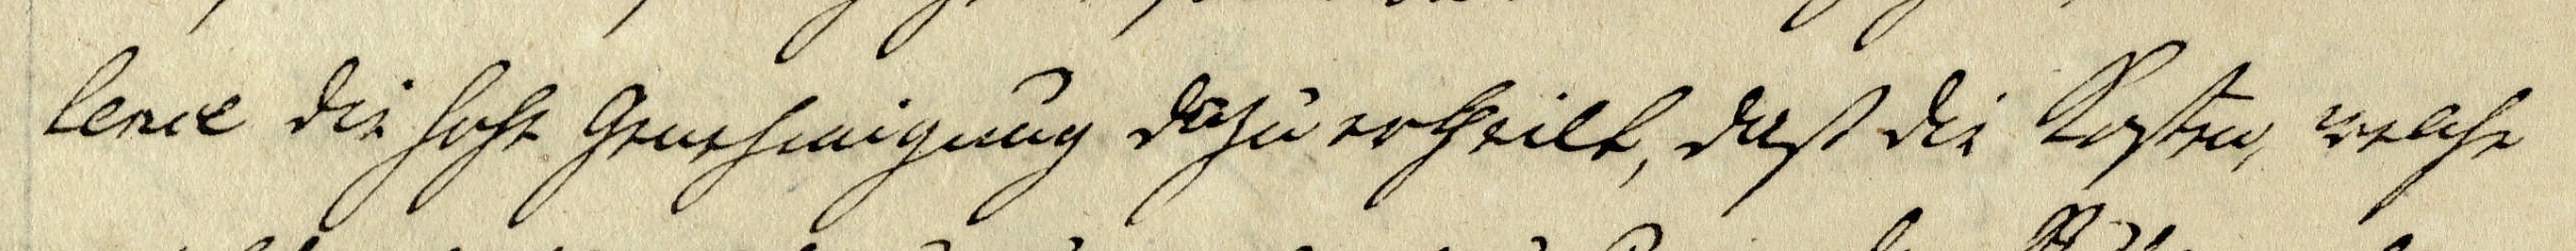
lence die hohe Genehmigung dazu ertheilt, daß die Kosten, welche
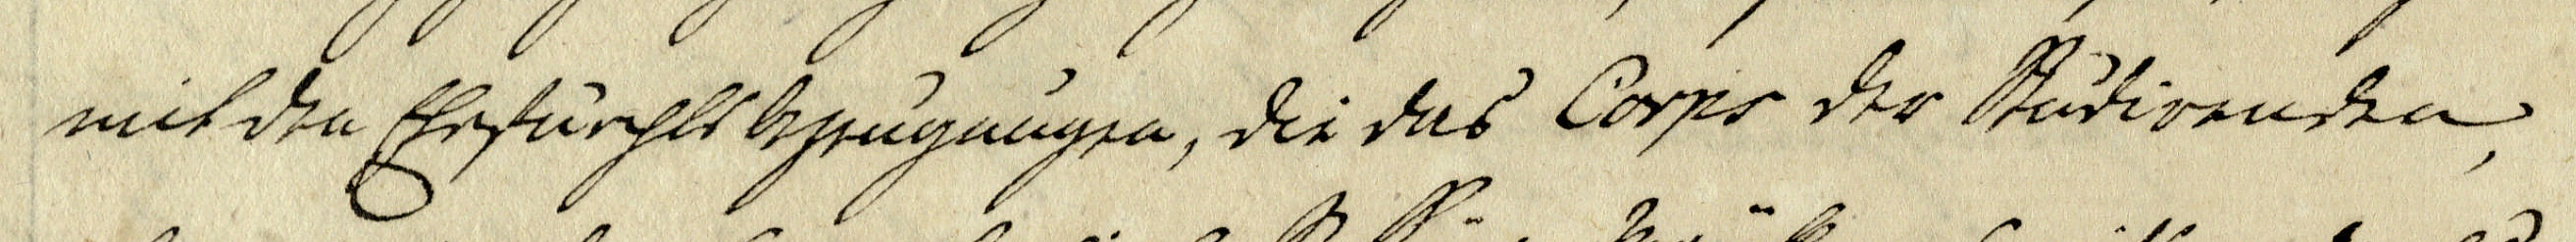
mit den Ehrfurchtsbezeugungen, die das Corps der Studirenden,
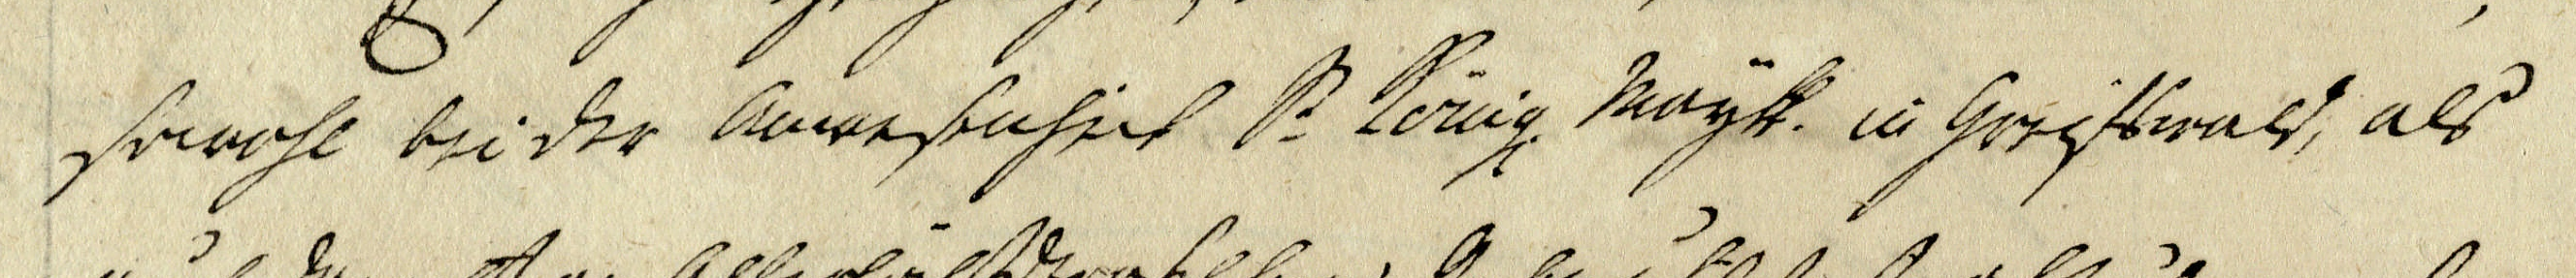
sowohl bei der Anwesenheit Sr. Königl Maÿtt. in Greifswald, als
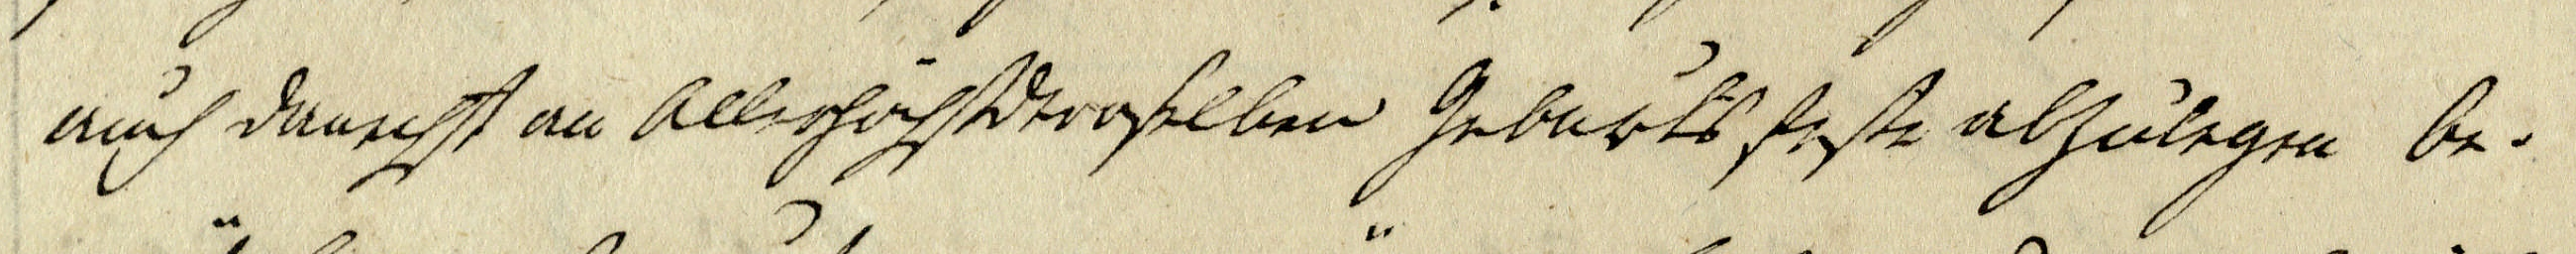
auch danechst an Allerhöchstderselben Geburtsfeste abzulegen be¬
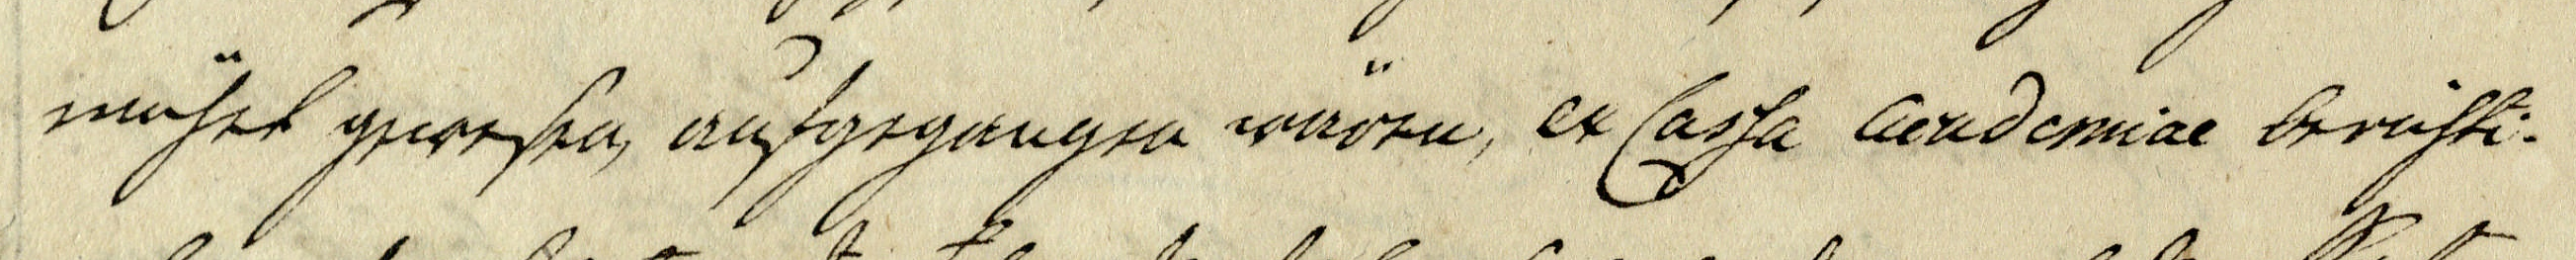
mühet gewesen, aufgegangen wären, ex Cassa Academiae berichti¬
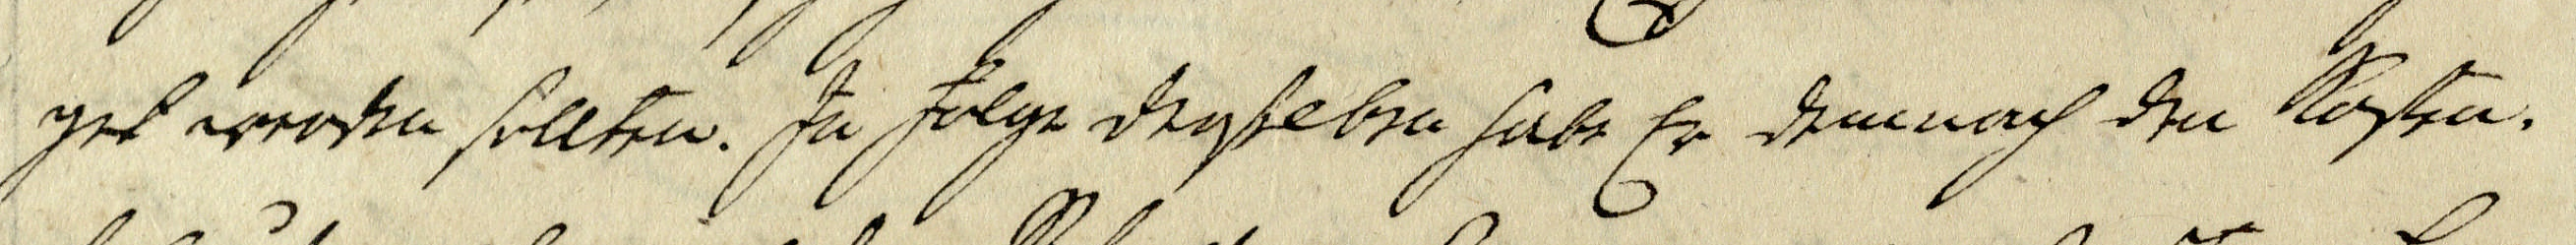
get werden sollten. In Folge derselben habe Er demnach den Kosten¬
